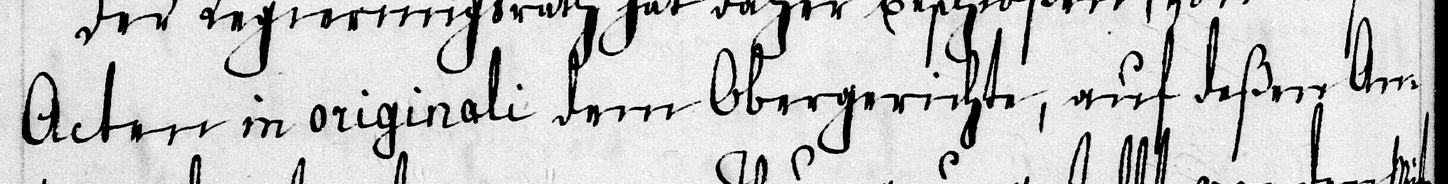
Acten in originali dem Obergerichte, auf deßen An¬
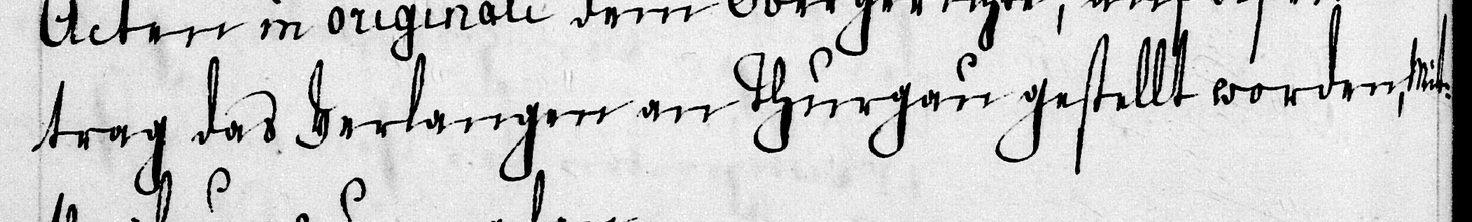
trag das Verlangen an Thurgau gestellt worden, Mit¬
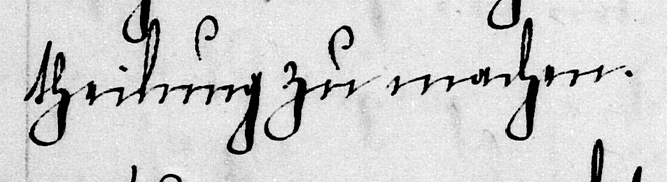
theilung zu machen.
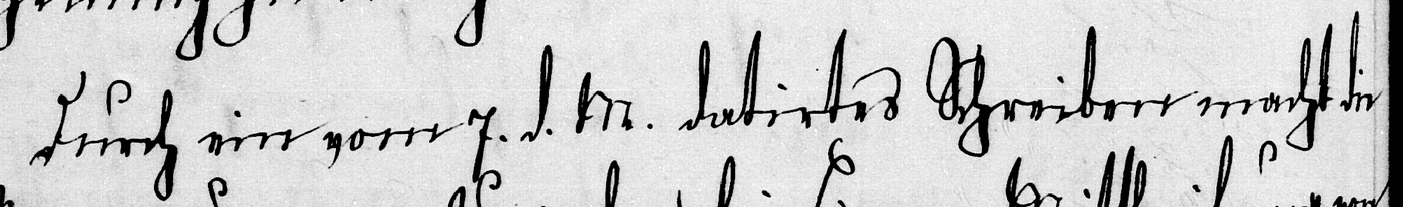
Durch ein vom 7. d. M. datirtes Schreiben macht
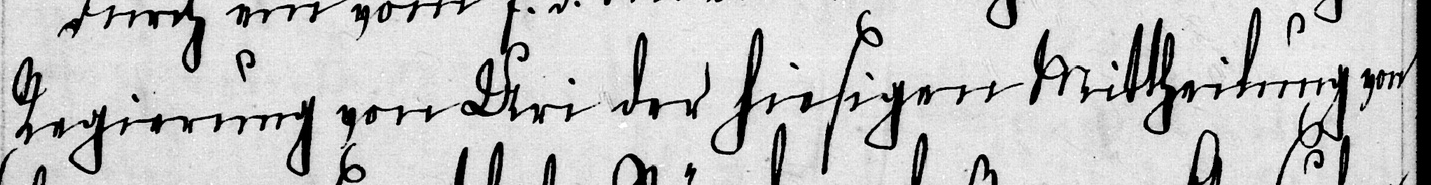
Regierung von Uri der hiesigen Mittheilung von
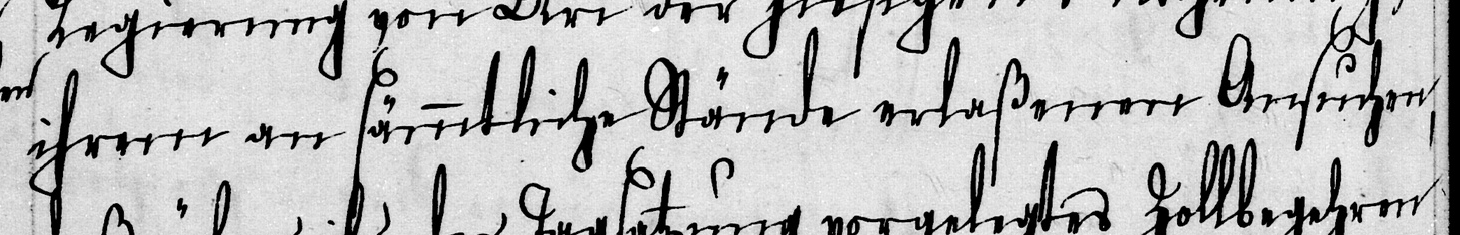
ihrem an sämmtliche Stände erlaßenen Ansuchen,
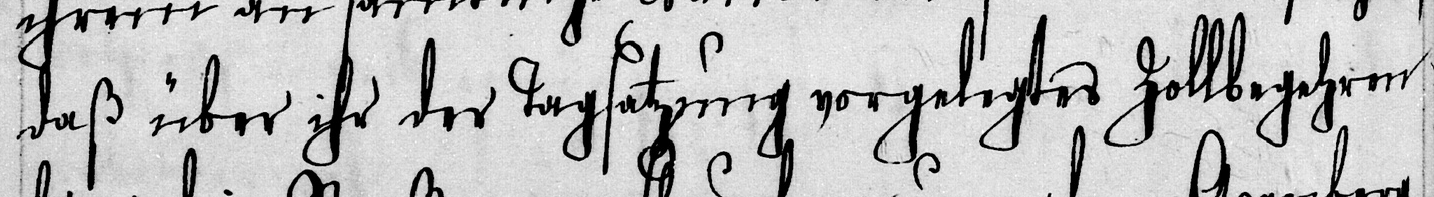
daß über ihr der Tagsatzung vorgelegtes Zollbegehren
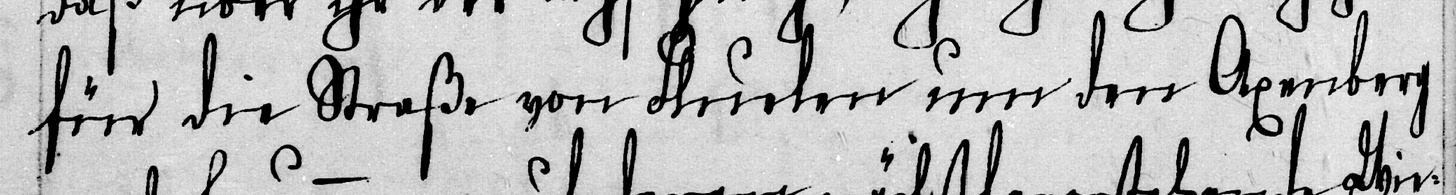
für die Straße von Fluelen um den Axenberg
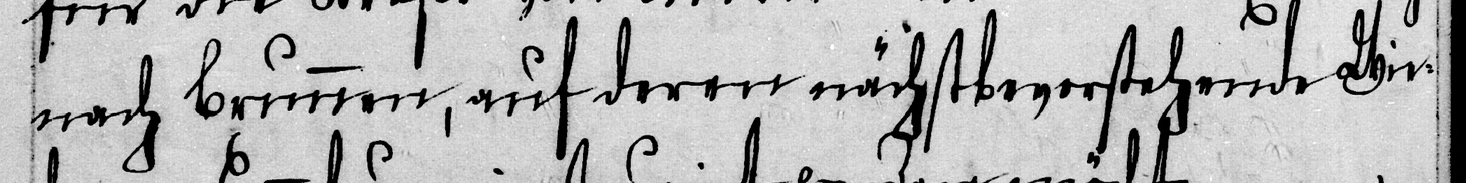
nach Brunnen, auf deren nächstbevorstehende Wie¬
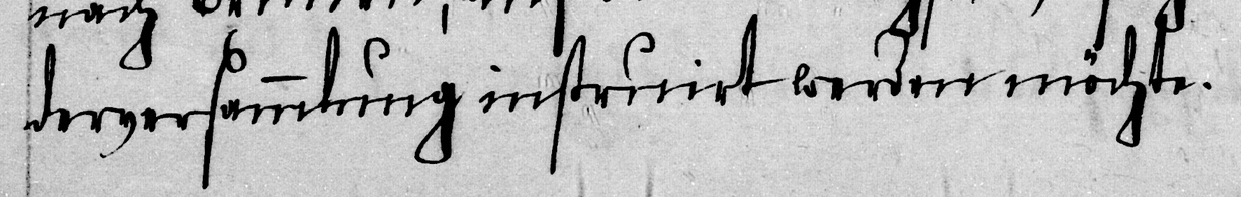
derversammlung instruirt werden möchte.
